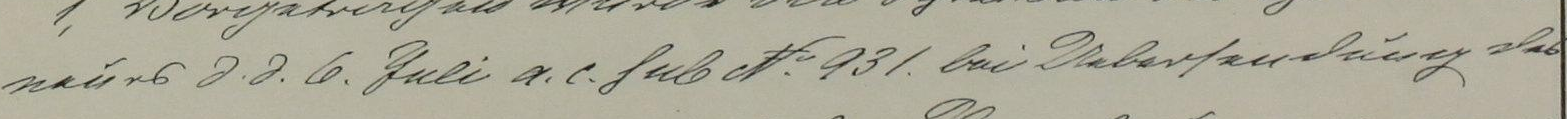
neurs d.d. 6. Juli a.c. sub No. 931. bei Uebersendung des
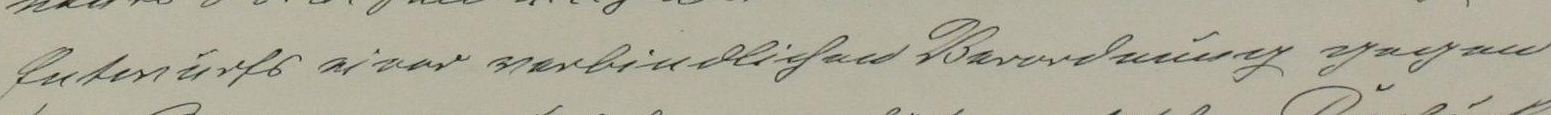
Entwurfs einer verbindlichen Verordnung gegen
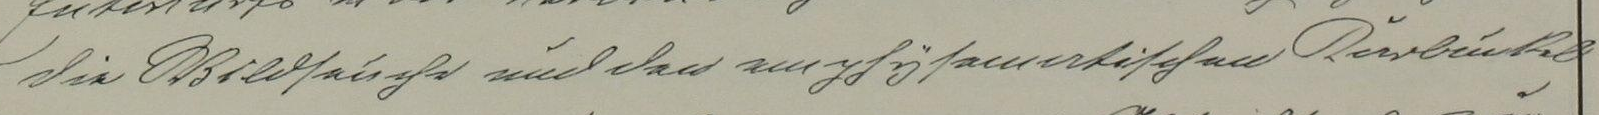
die Wildseuche und den emphysematischen Karbunkel
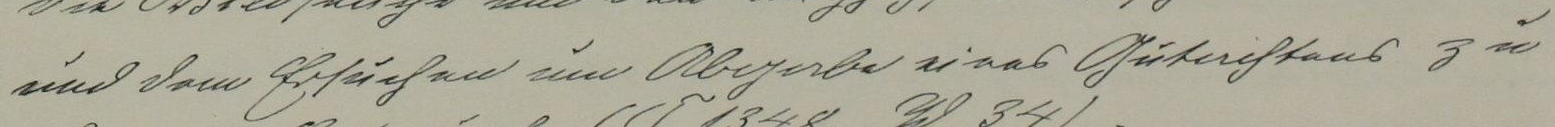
und dem Ersuchen um Abgabe eines Gutachtens zu
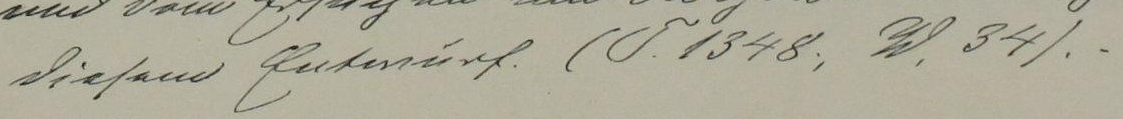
diesem Entwurf. (T.1348; W.34).
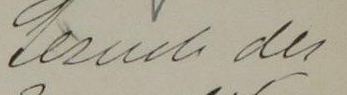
Gesuche des
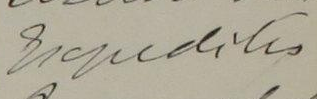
Expeditors
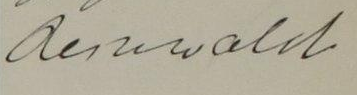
Reinwald
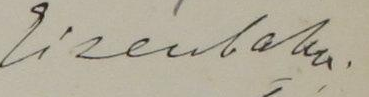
Eisenbahn
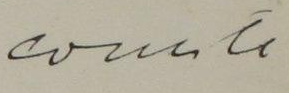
comité
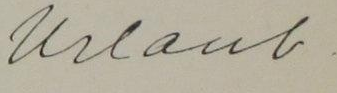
Urlaub
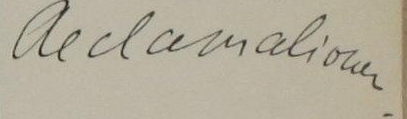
Reclamationen
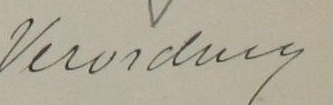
Verordnung
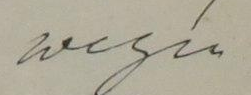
wegen
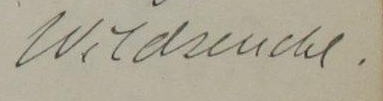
Wildseuche.
